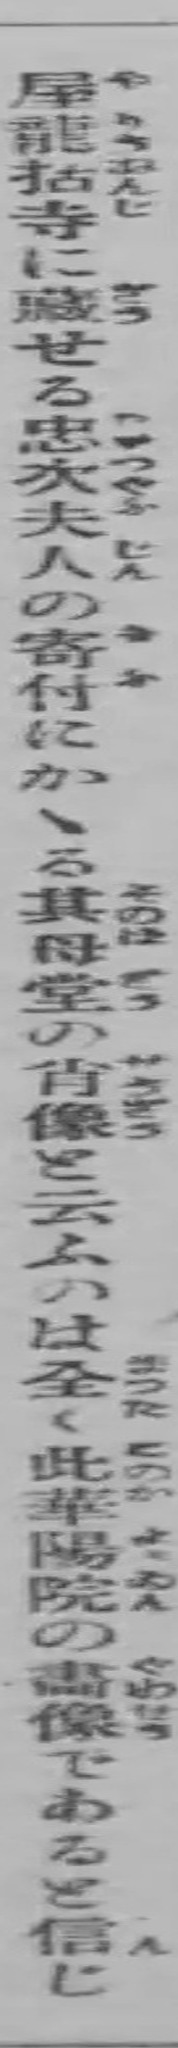屋龍拈寺に蔵せる忠次夫人の寄付にかゝる其母堂の肖像と云ふのは全く此華陽院の画像であると信じ
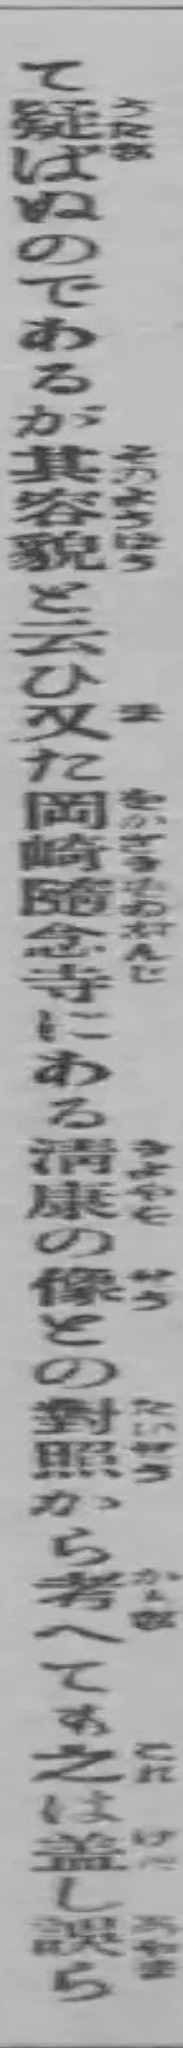て疑はぬのであるが其容貌と云ひ又た岡崎隨念寺にある清康の像との対照から考へても之は蓋し誤ら
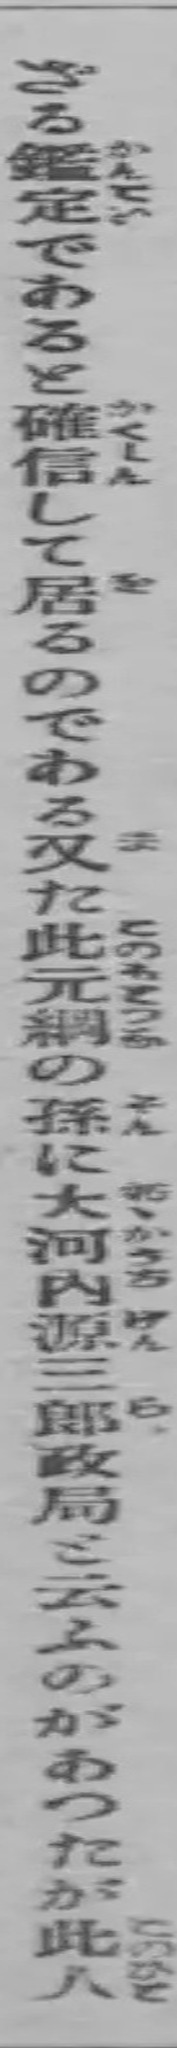大河内政局ざる鑑定であると確信して居るのである又た此元網の孫に大河内源三郎政局と云ふのがあつたが此人
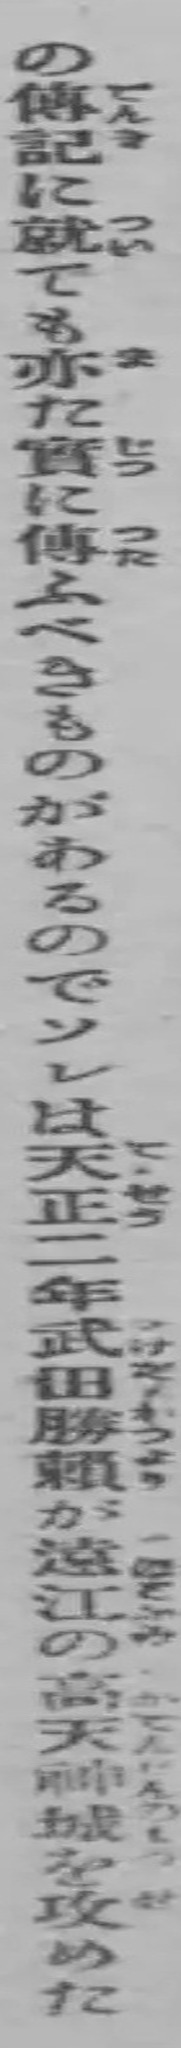の伝記に就ても亦た実に伝ふべきものがあるのでソレは天正二年武田勝頼が遠江の高天神城を攻めた
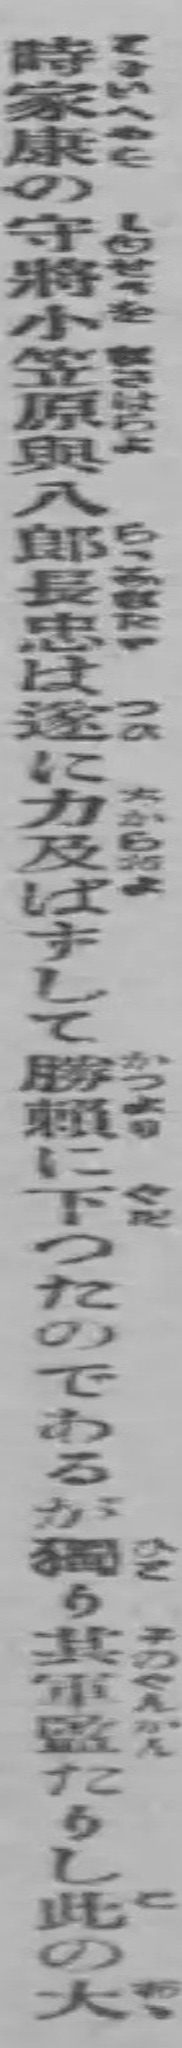時家康の守将小笠原與八郎長忠は遂に力及ばずして勝頼に下つたのであるが独り其軍監たりし此の大
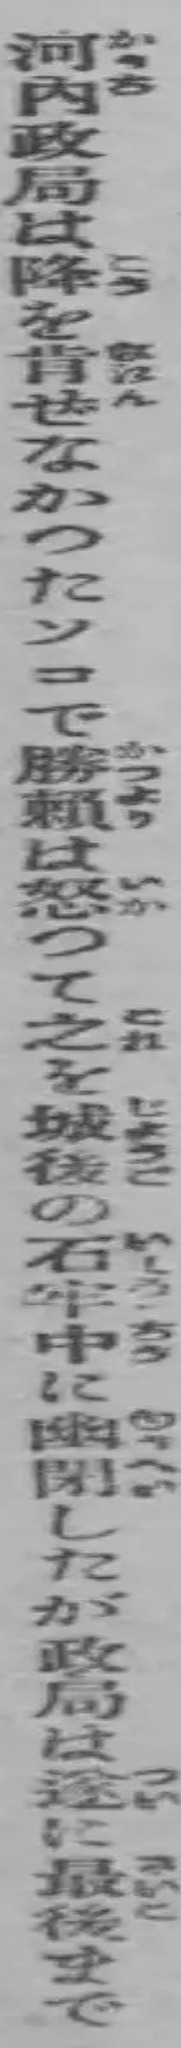河内政局は降を肯ぜなかつたソコで勝頼は怒つて之を城後の石牢中に幽閉したが政局は遂に最後まで

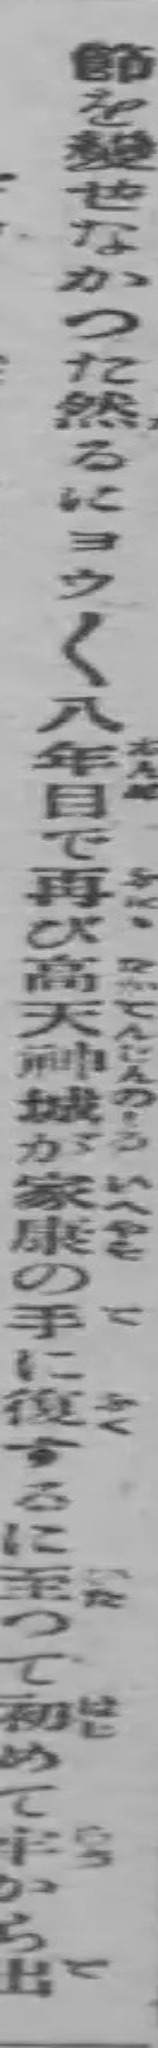節を変ぜなかつた然るにヨウ〳〵八年目で再び高天神城が家康の手に復するに至つて初めて牢から出
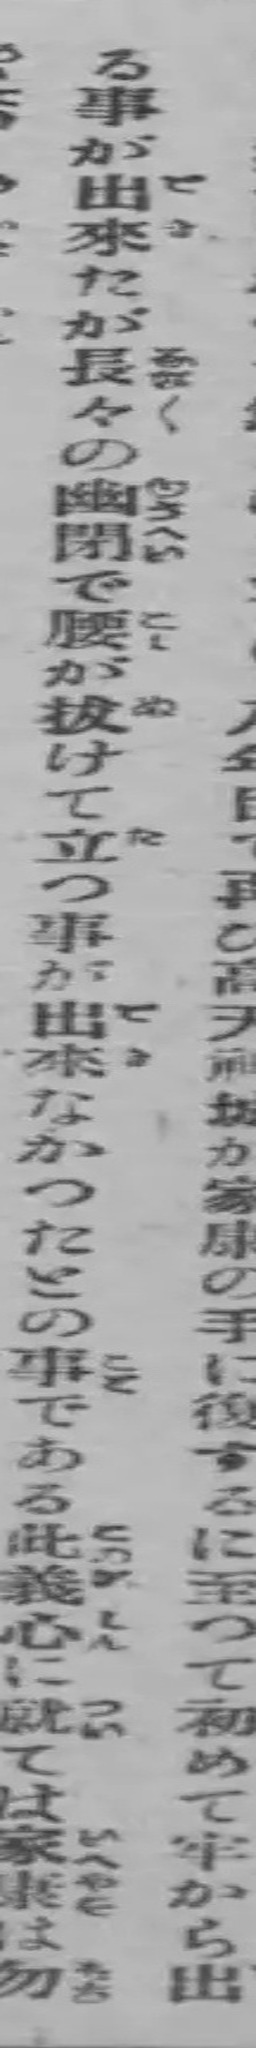る事が出来たが長々の幽閉で腰が抜けて立つ事が出来なかつたとの事である此義心に就ては家康は勿
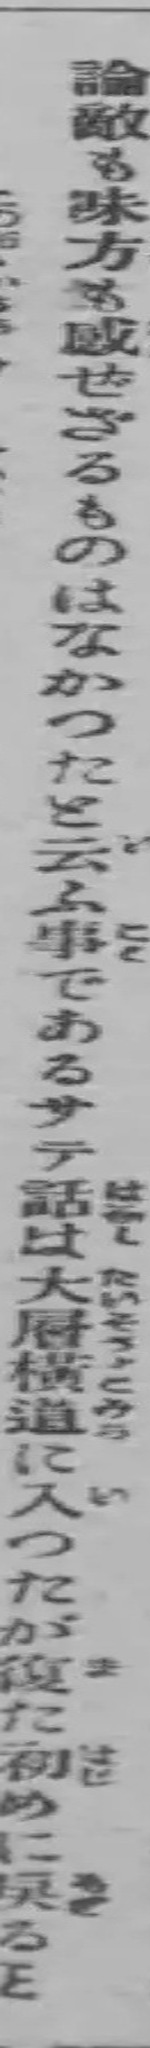論敵も味方も感ぜざるものはなかつたと云ふ事であるサテ話は大層横道に入つたが復た初めに戻ること
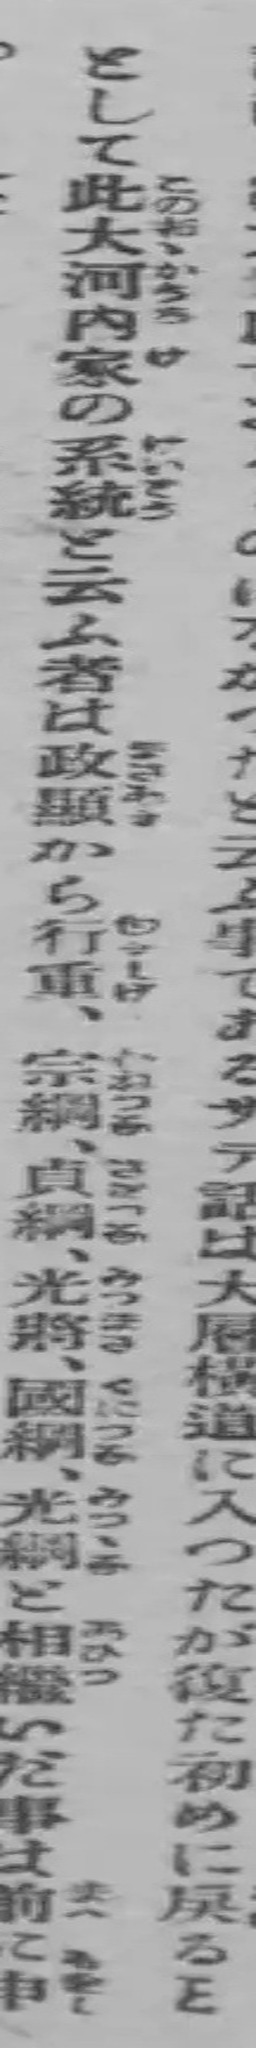として此大河内家の系統と云ふ者は政顕から行重、宗綱、貞綱、光将、光綱と相継いだ事は前に申
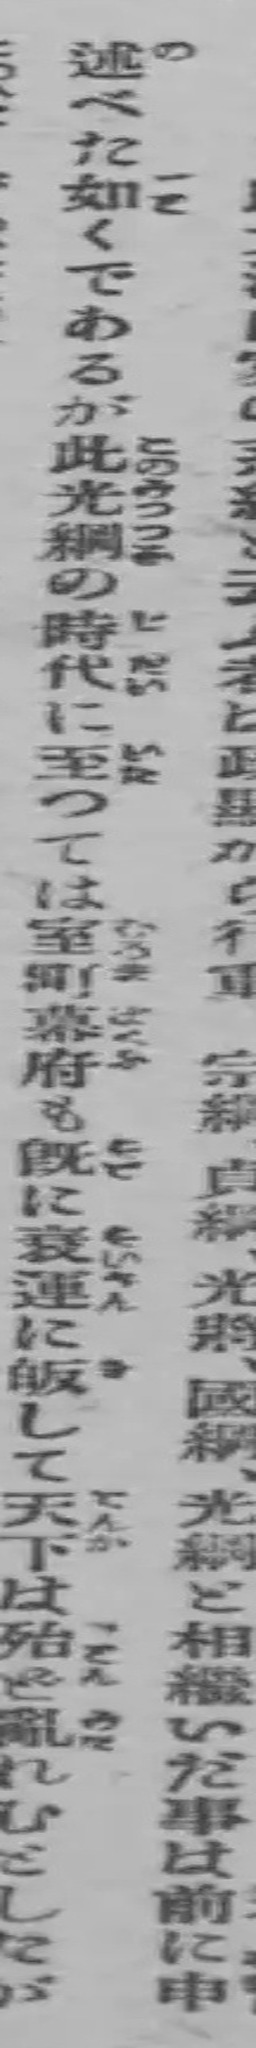大河内光綱述べた如くであるが此光綱の時代に至つては室町幕府も既に衰運に皈して天下は殆ど乱れむとしたが
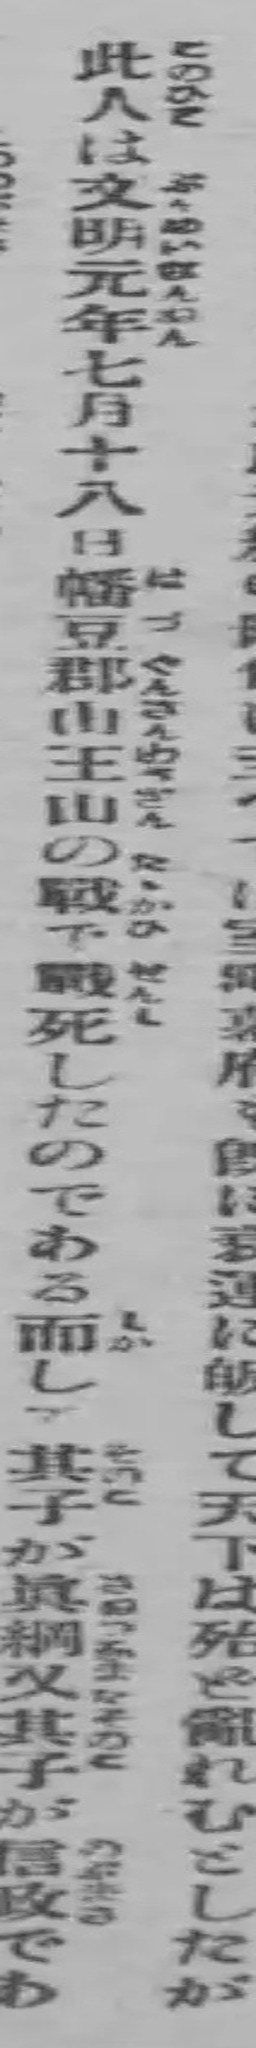大河内信政此人は文明元年七月十八日幡豆郡山王山の戦で戦死したのである而して其子が眞綱又其子が信政であ
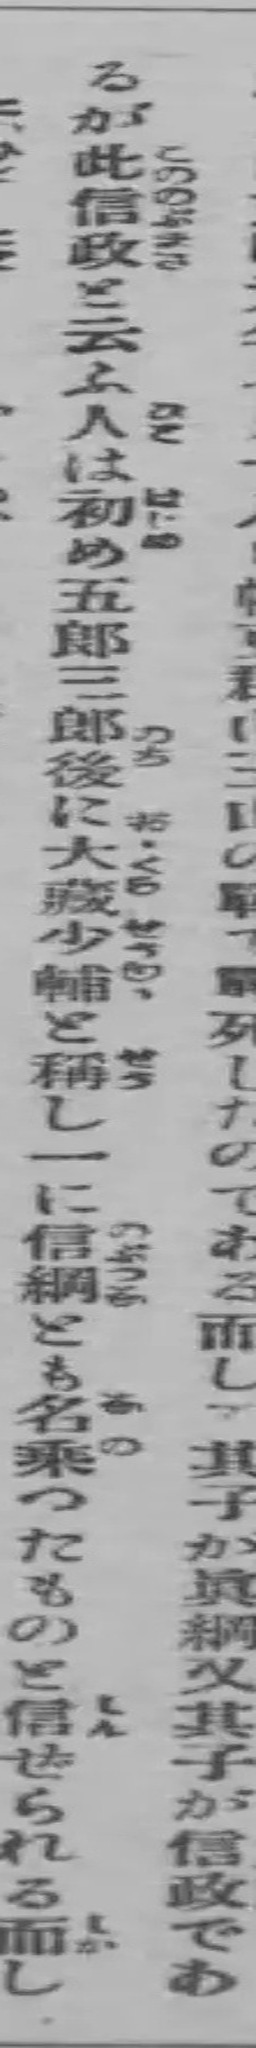るが此信政と云ふ人は初め五郎三郎後に大蔵少輔と称し一に信綱とも名乗つたものと信ぜられる而し
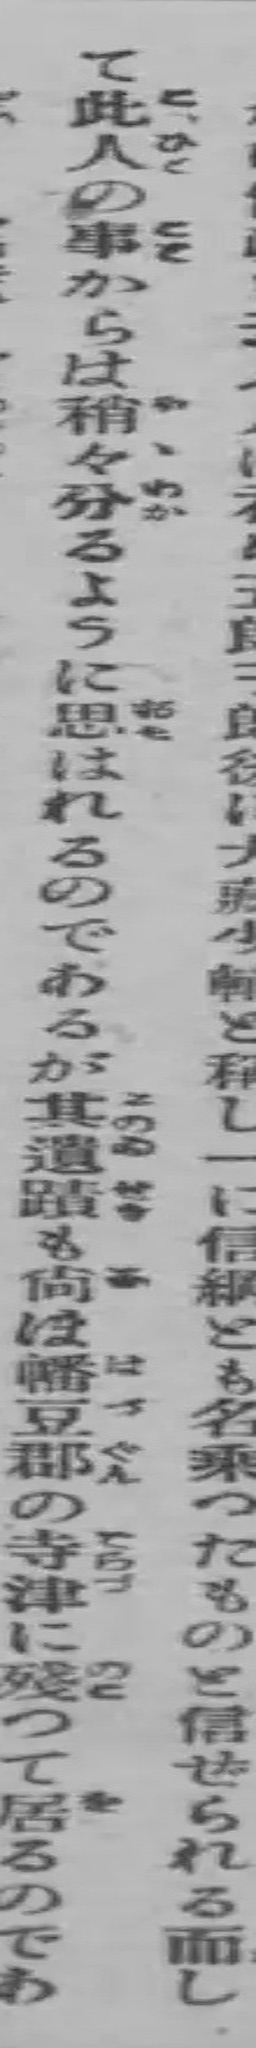て此人の事からは稍々分るように思はれるのであるが其遺蹟も尚ほ幡豆郡の寺津に残つて居るのであ
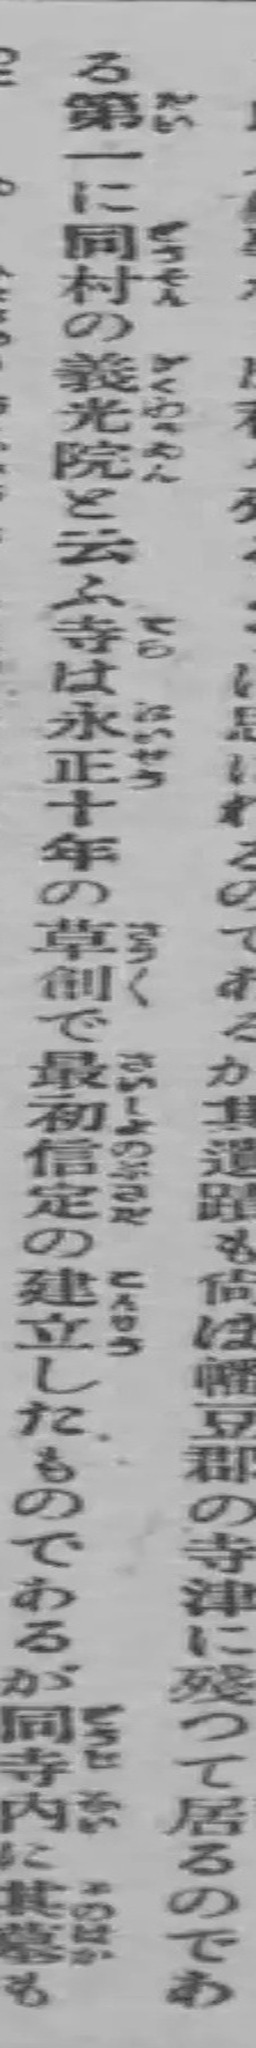義光院る第一に同村の義光院と云ふ寺は永正十年の草創で最初信定の建立したものであるが同寺内に其墓も
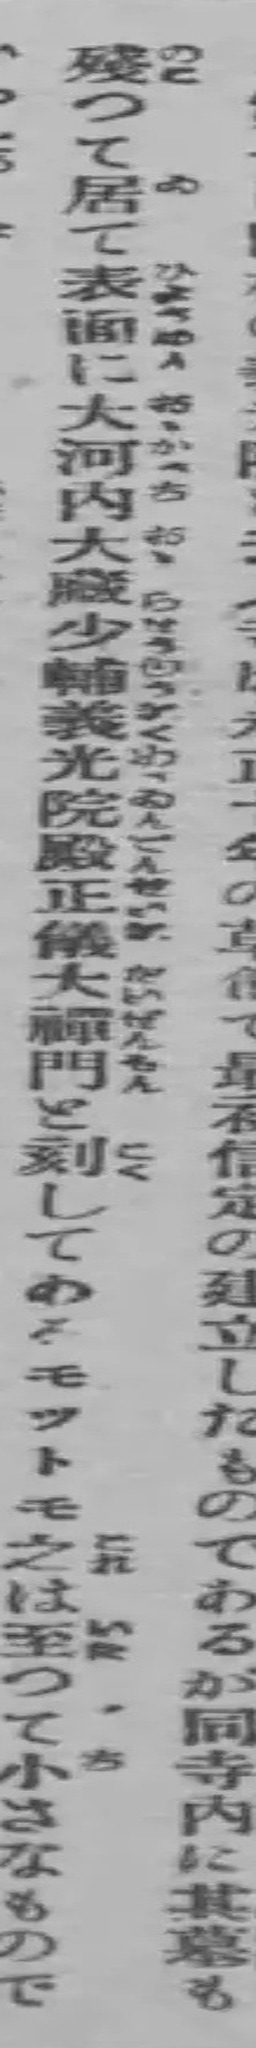残つて居て表面に大河内大蔵少輔義光院殿正儀大禅門と刻してあるモツトモ之は至つて小さなもので
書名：豊橋市史談
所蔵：国立国会図書館 National Diet Library, JAPAN
